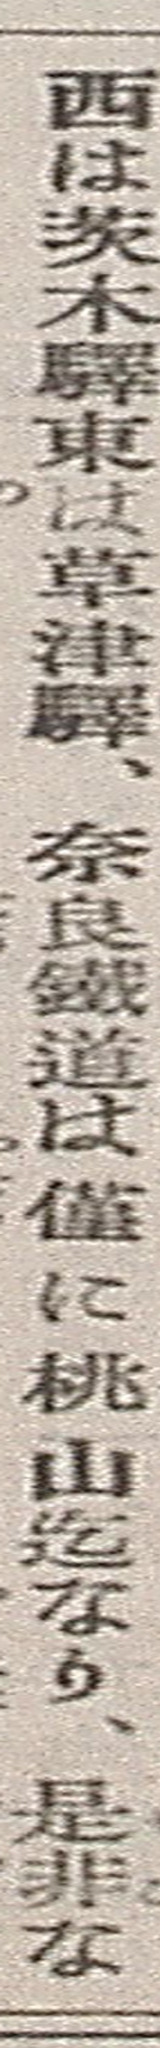西は茨木駅東は草津駅、奈良鉄道は僅に桃山迄なり、是非な
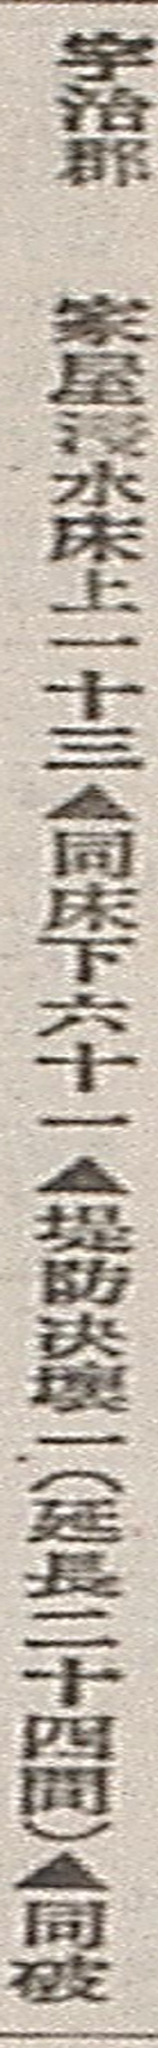宇治郡家屋浸水床上一十三▲同床下六十一▲堤防決壊一▲同破
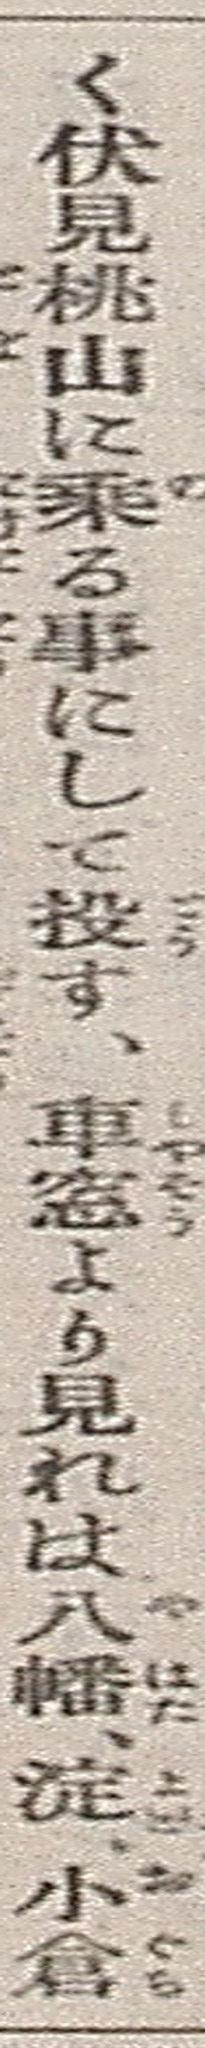く伏見桃山に乗る事にして投す、車窓より見れば八幡、淀、小倉
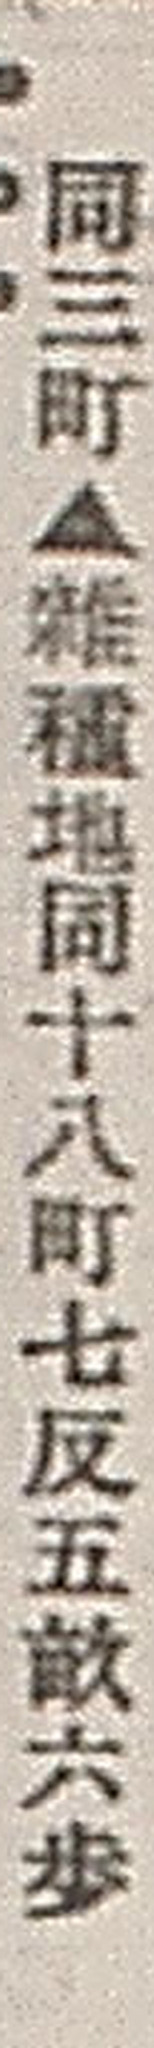同三町▲雑種地同十八町七反五畝六歩
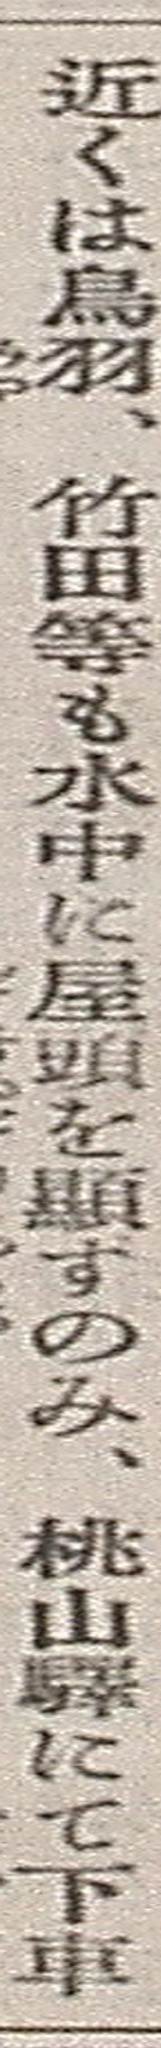近くは鳥羽、竹田等も水中に屋頭を顕すのみ、桃山駅にて下車
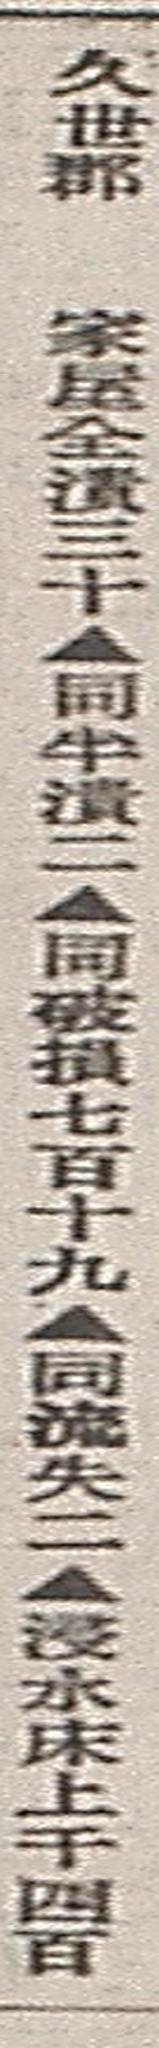久世郡家屋全潰三十▲同半潰二▲同破損七百十九▲同流失二▲浸水床上千四百
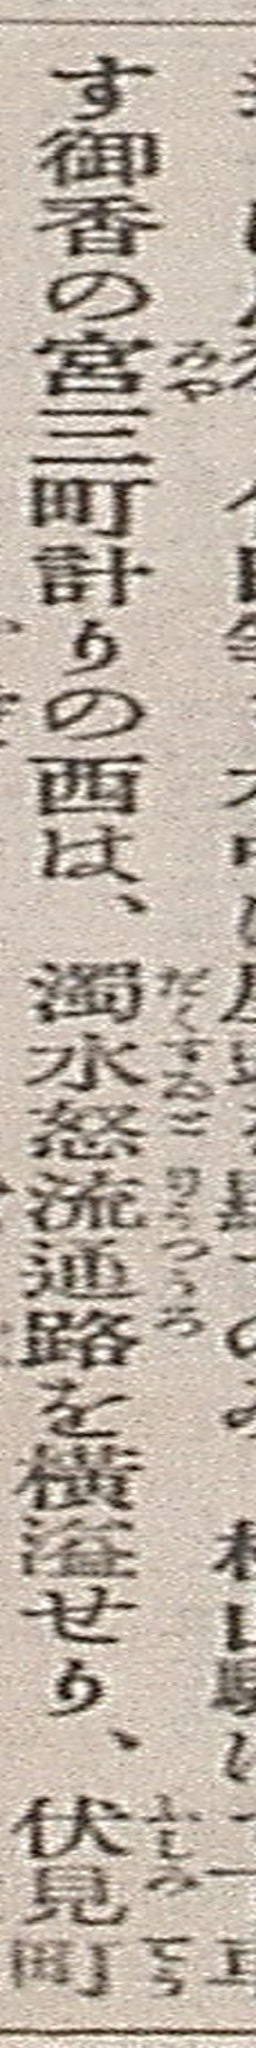す御香の宮三町計りの西は、濁水怒流通路を横溢せり、伏見町
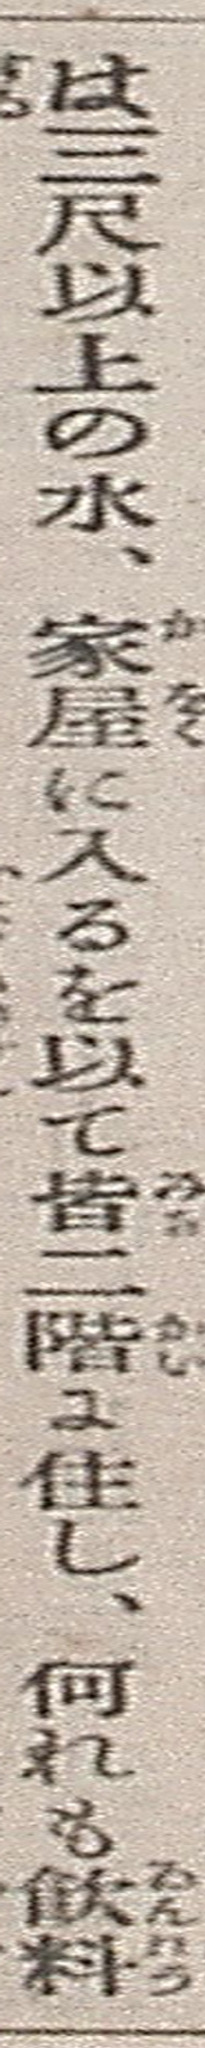は三尺以上の水、家屋に入るを以て皆二階に住し、何れも飲料
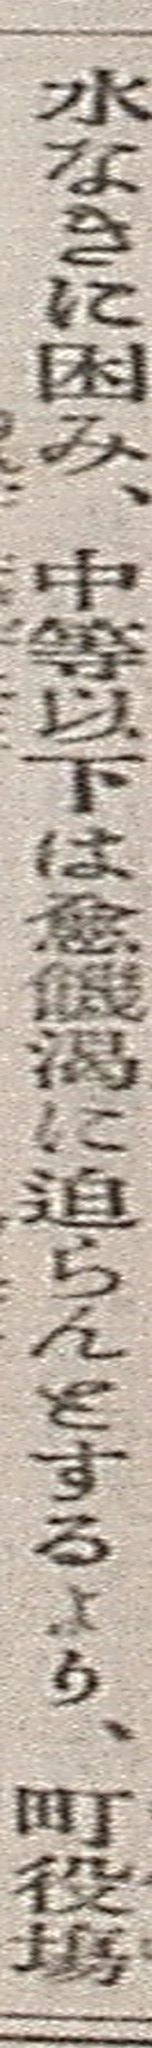水なきに因み、中等以下は愈飢渇にに迫らんとするより、町役場
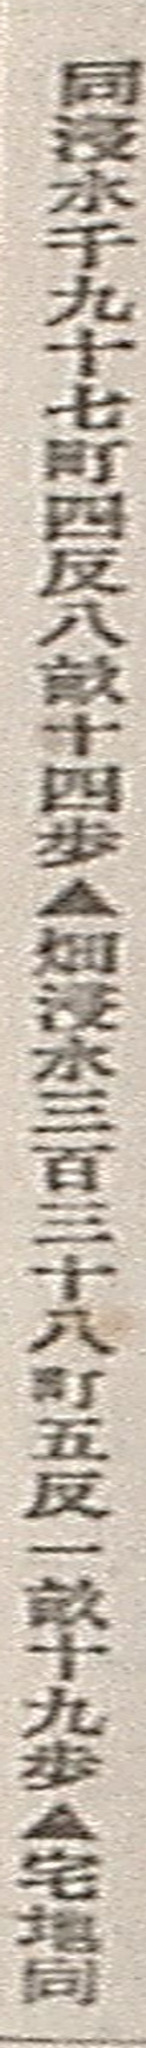同浸水千九十七町四反八畝十四歩▲畑浸水三百三十八町五反一畝十九歩▲宅地同
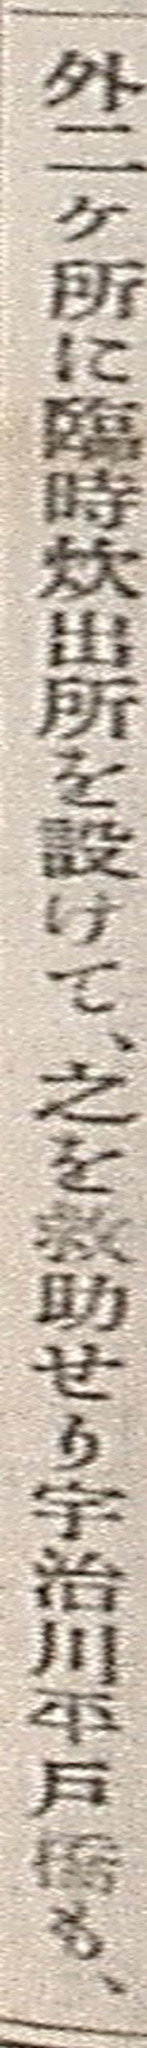外二ヶ所に臨時炊出所を設けて、之を救助せり宇治川平戸橋も
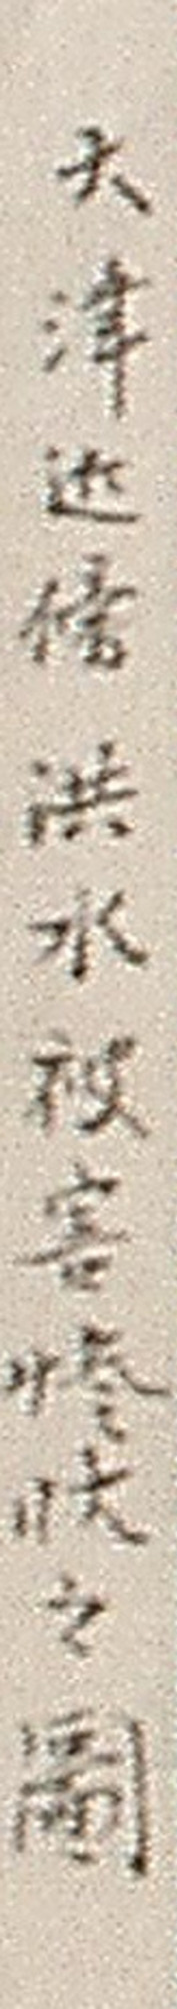大津近傍洪水被害惨状之図

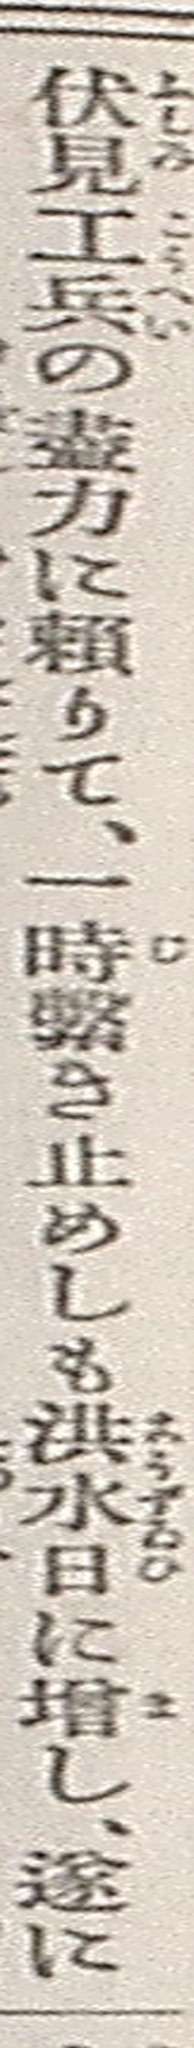伏見工兵の尽力に頼りて、一時繋き止めしも洪水日に増し、遂に
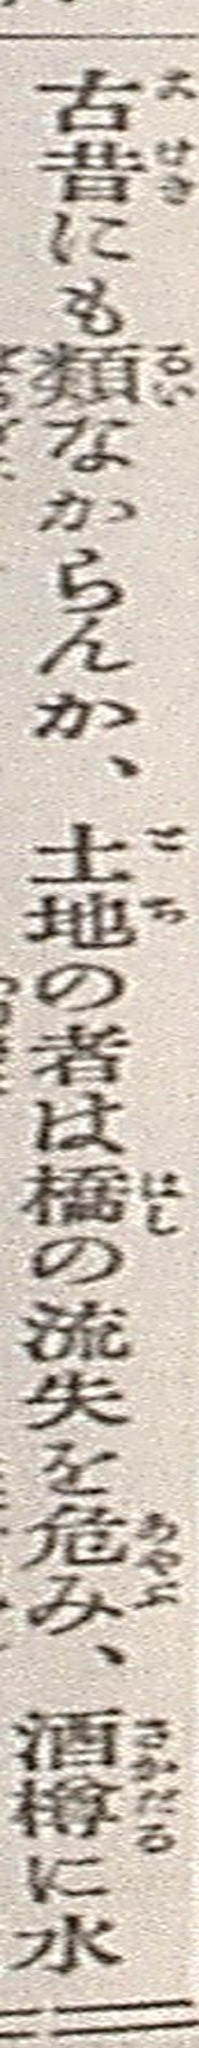古昔にも類なからんか、土地の者は橋の流失を危み、酒樽に水
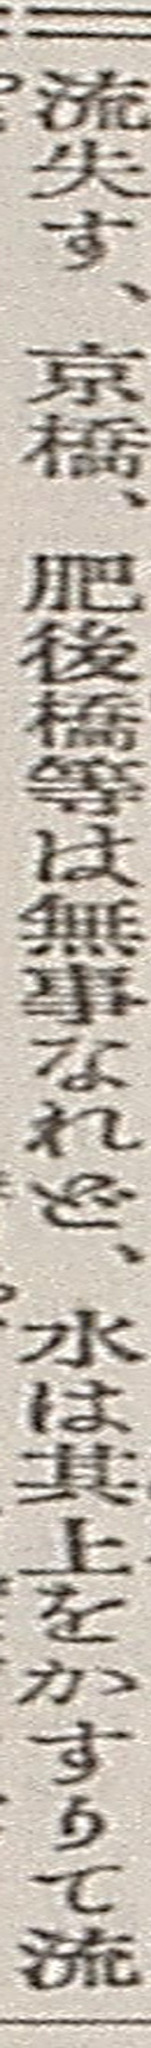流失す、京橋、肥後橋等は無事なれど、水は其上をかすりて流
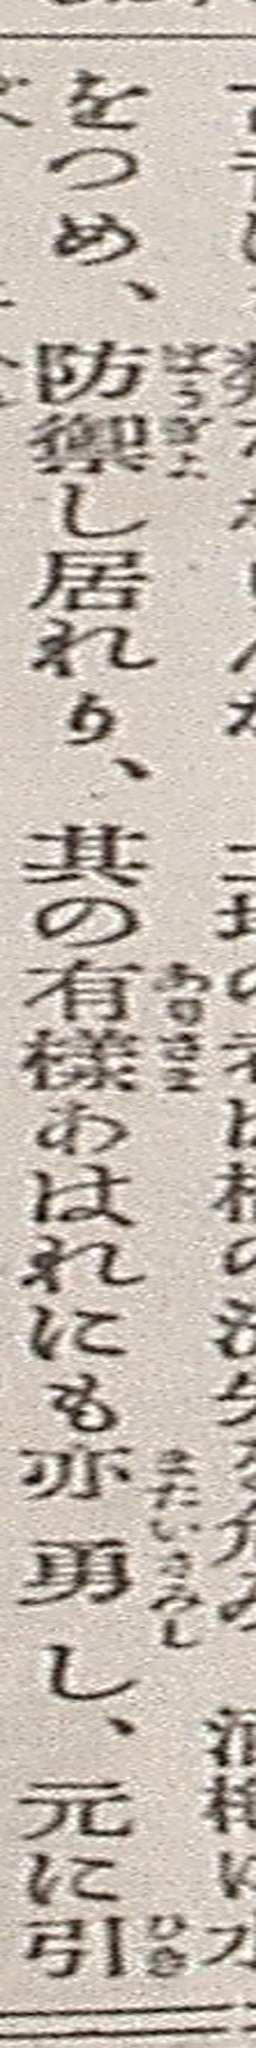をつめ、防禦し居れり、其の有様あはれにも亦勇し、元に引
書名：風俗畫報臨時増刊第百二十八號　洪水被害録（下）
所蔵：東京大学地震研究所図書室 Earthquake Research Institute Library, The University of Tokyo, JAPAN
